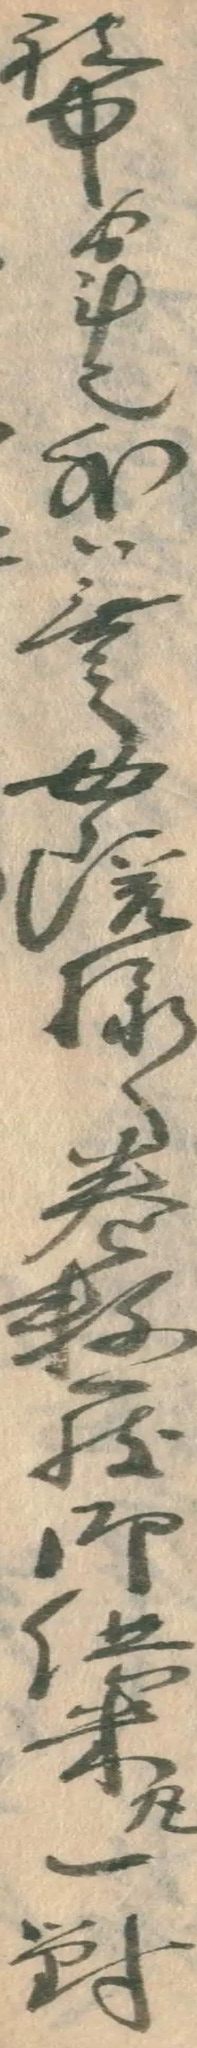社中ゟ計也外ハ無之女院様へ巻数一枝御供米丸一対
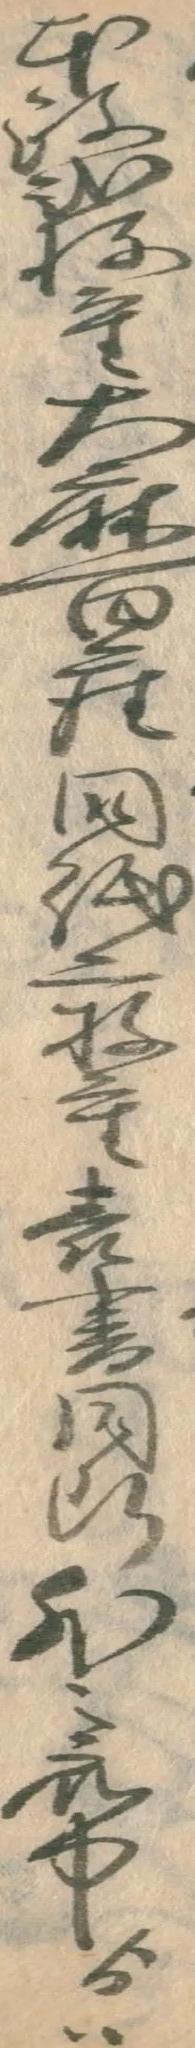本政弐枚重大麻百座同紙二枚重表書同断外之衆中ゟハ
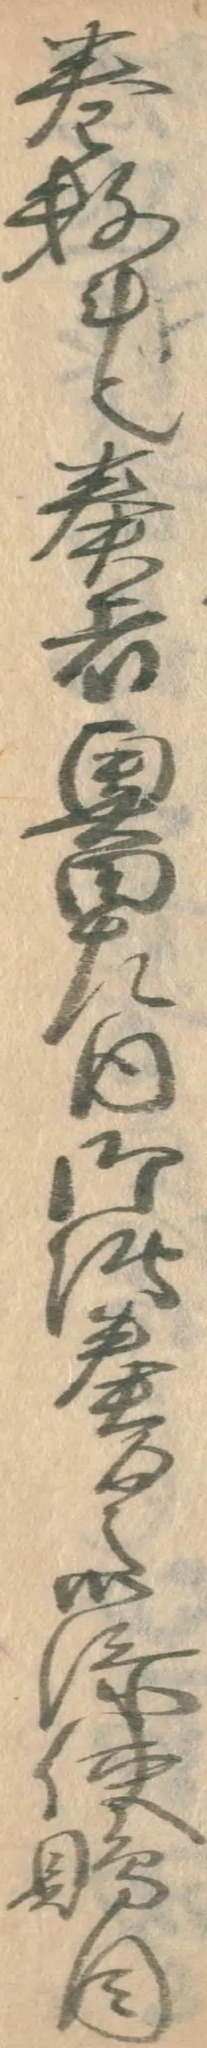巻数計也奏者奥田左内御伝奏ゟ之御添使鵙目

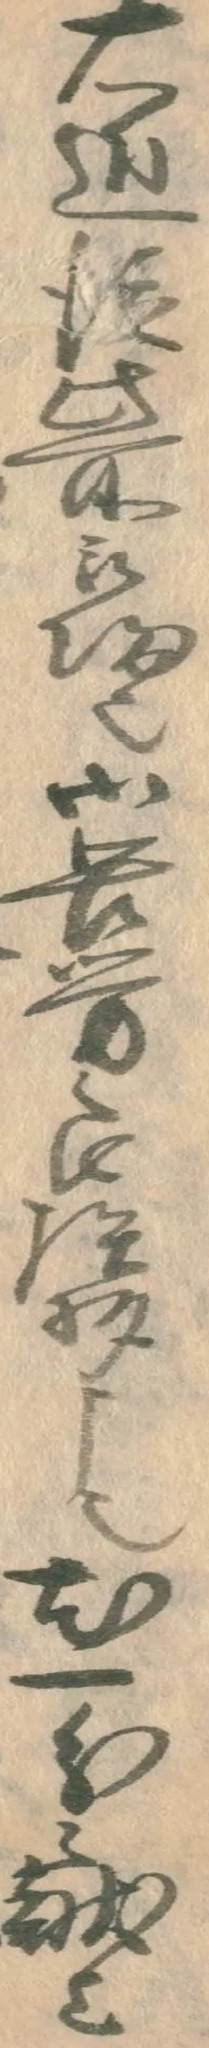右近従此所被帰也御苦労之由挨拶申也尤一分之献上
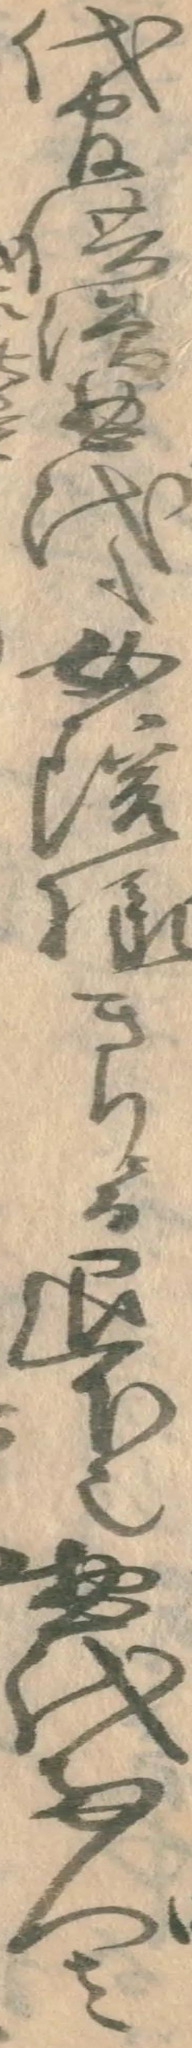代官供僧惣代も女院様きりニ而退下也惣代両人者
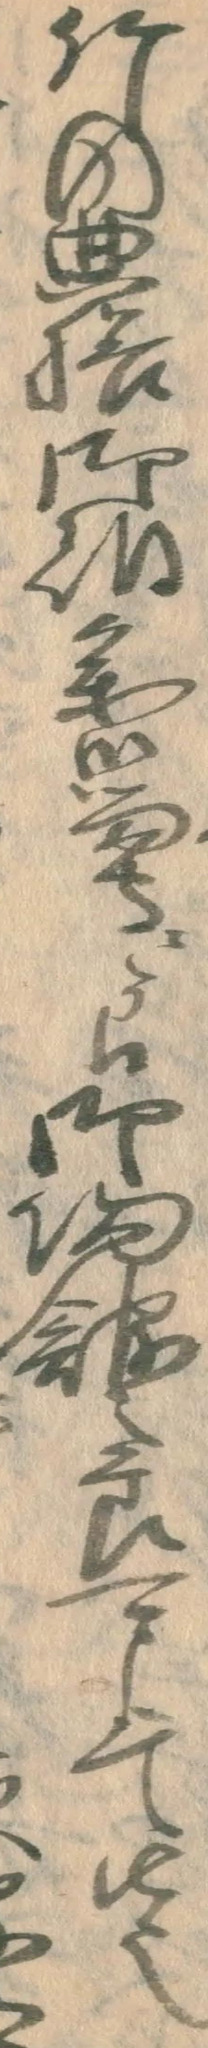竹内典膳御朝参御留守ニ候間御帰館之節可申上由也
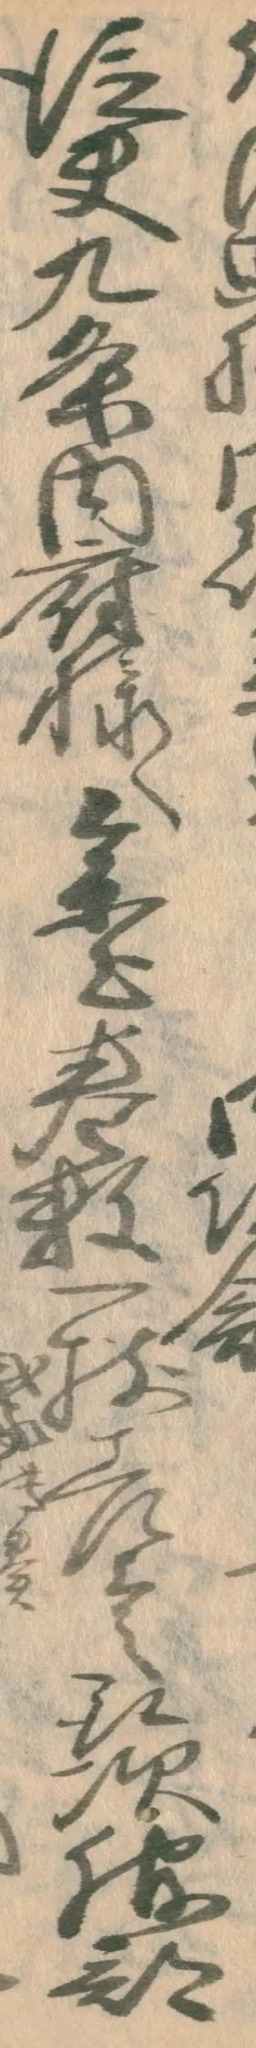従夫九条内府様へ参上巻数一枝差上之取次服部
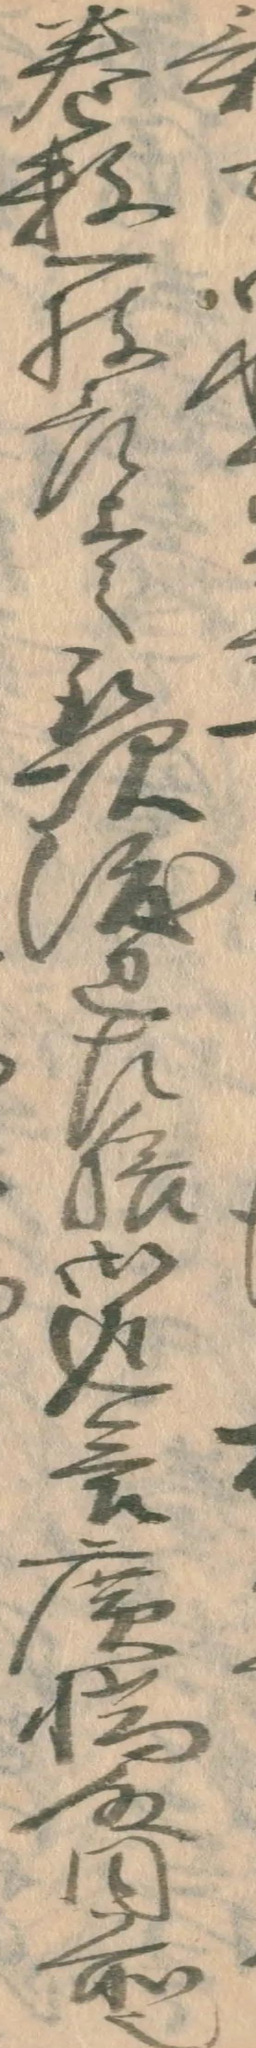巻数一枝差上之取次渡辺左膳御返答広橋殿同前也
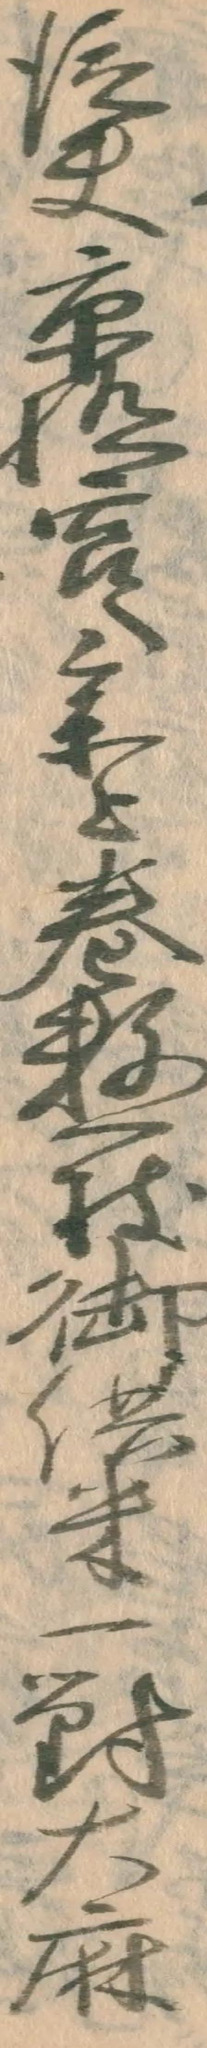従夫京極宮へ参上巻数一枝御供米一対大麻
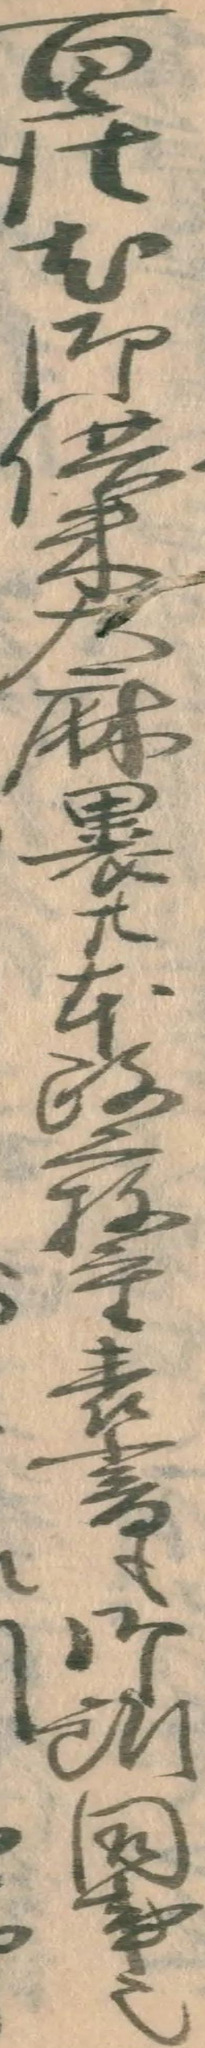百座尤御供米大麻裏共本政二枚重表書も御所同事也
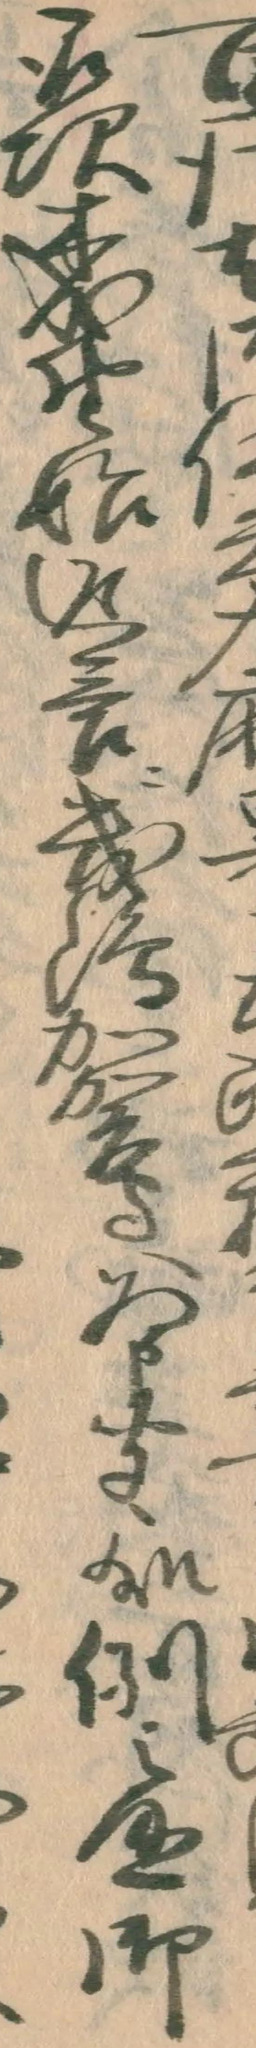取次森野始返答ニ幾島加賀守へ為申聞候処例之通御
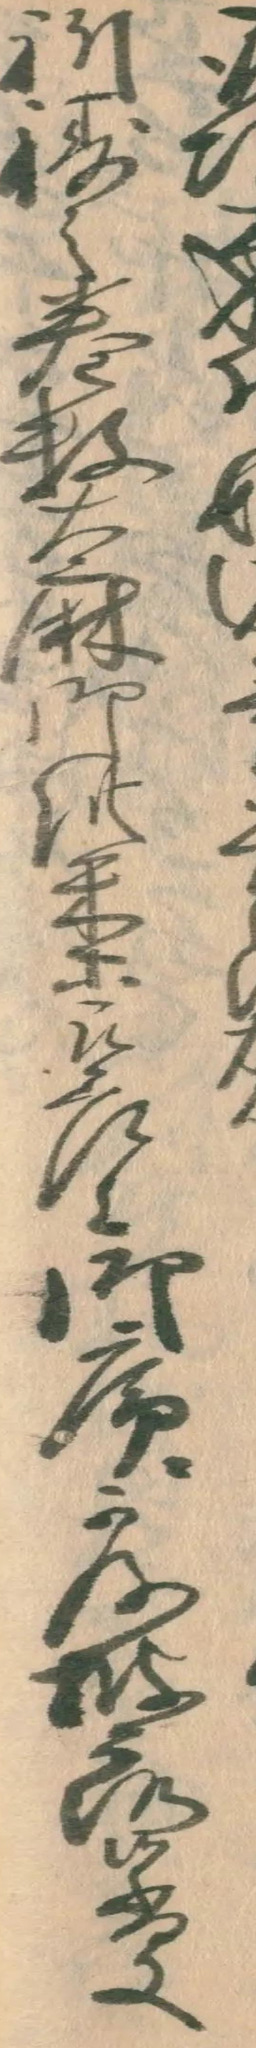祈祷之巻数大麻御供米等被差上御序ニ可及披露候尚又
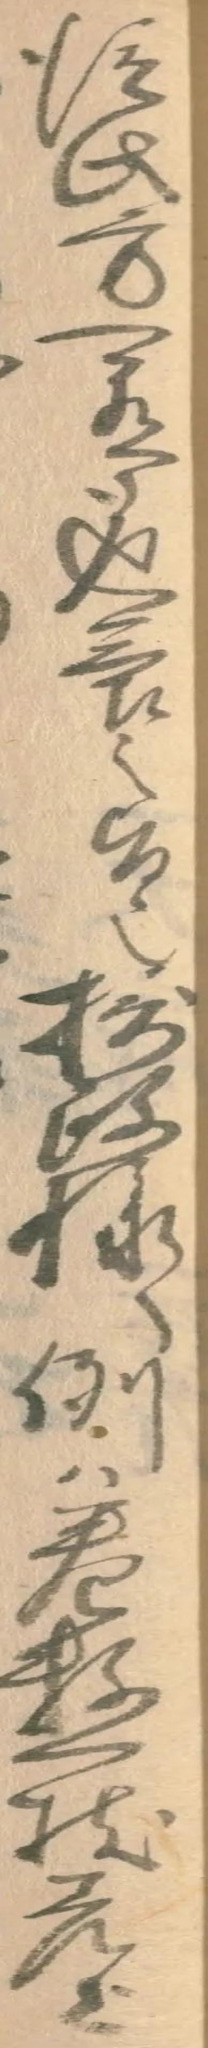従此方可有御返答之旨也摂政様へ例ハ巻数一枝差上
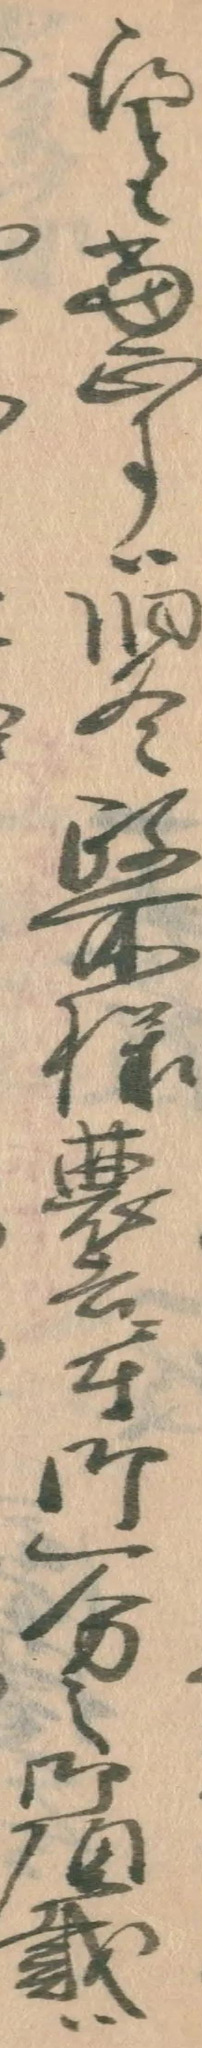候得とも当正月ハ旧冬政所様薨去ニ付御一分之御頂戴ハ
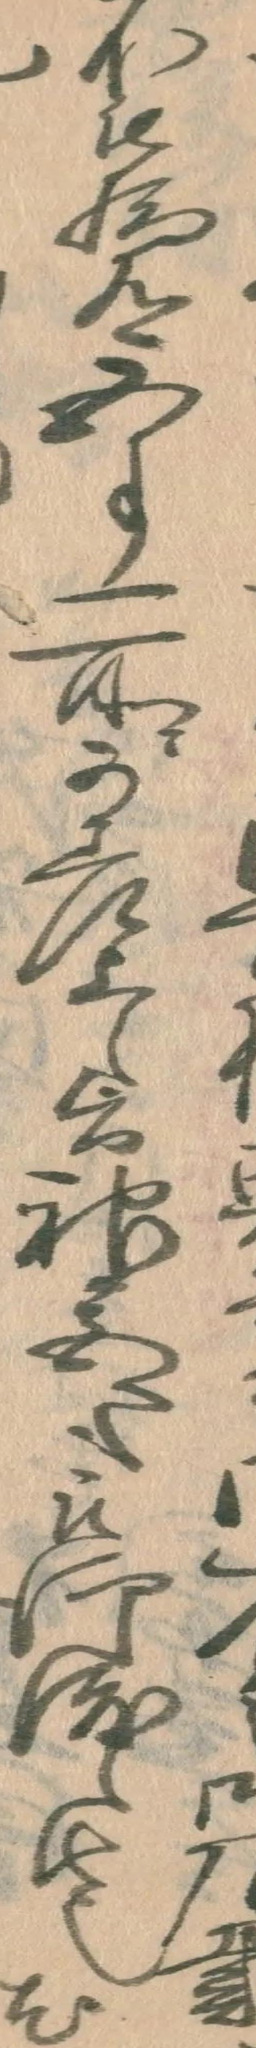不被為有五月一所ニ可差上候旨神宮へも被仰渡候由也尤
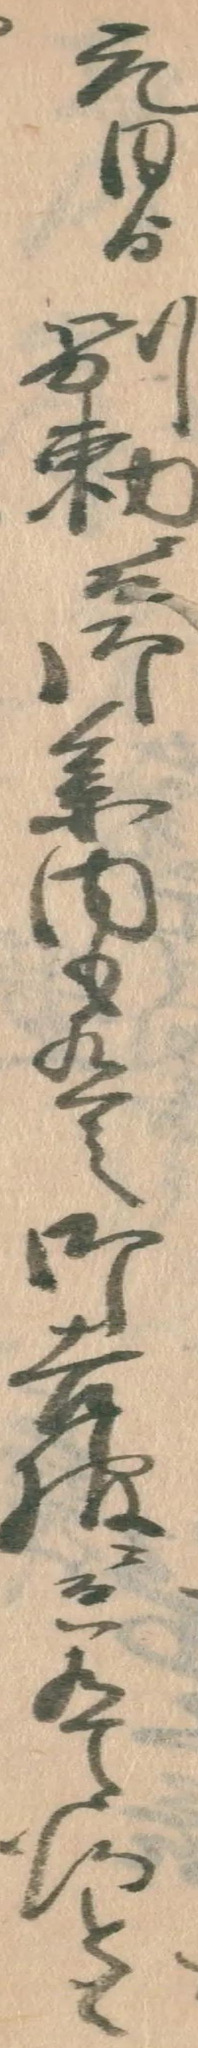元日ゟ別勅ニ而御参内も有之御吉服ニ而有之候得とも
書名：賀茂社記録. 第60冊
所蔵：国立国会図書館 National Diet Library, JAPAN
